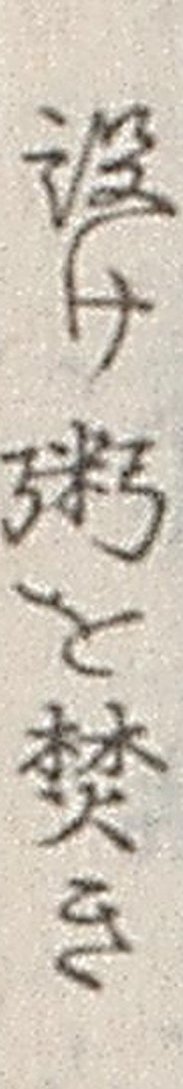設け粥を焚き
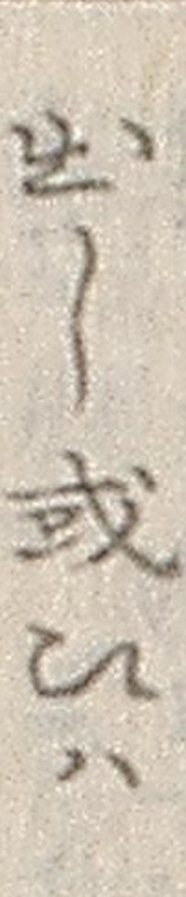出し或ひは
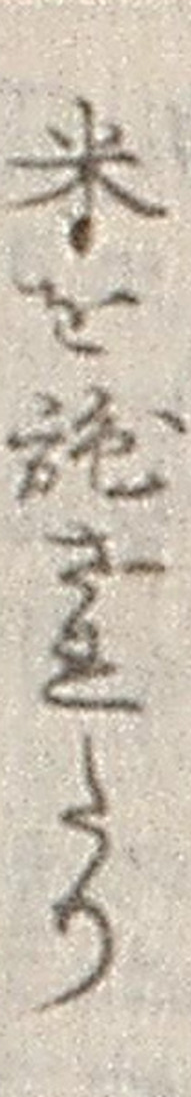米を施されたり
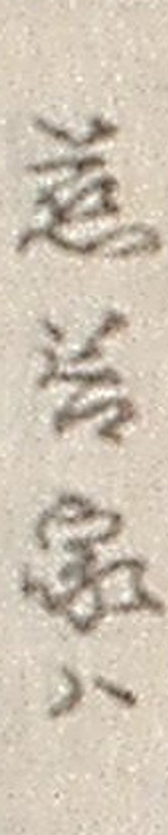慈善家は
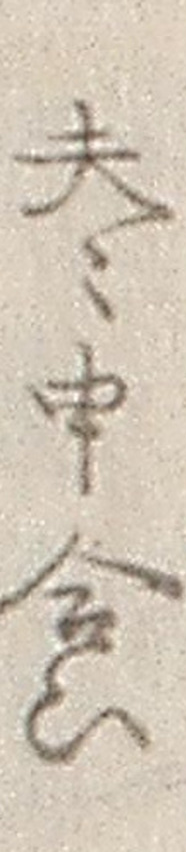夫々申合ひ
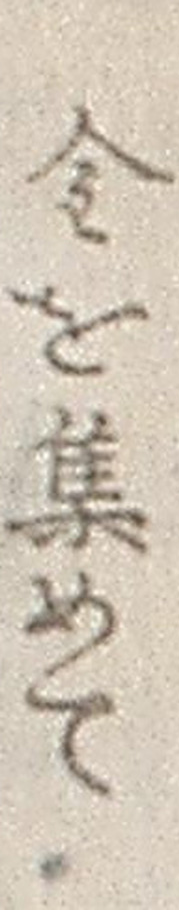金を集めて
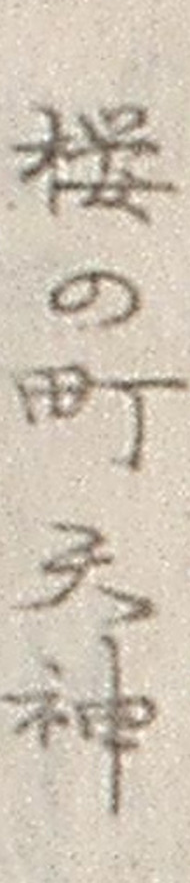桜の町天神
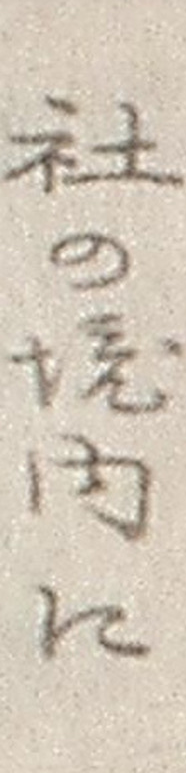社の境内に
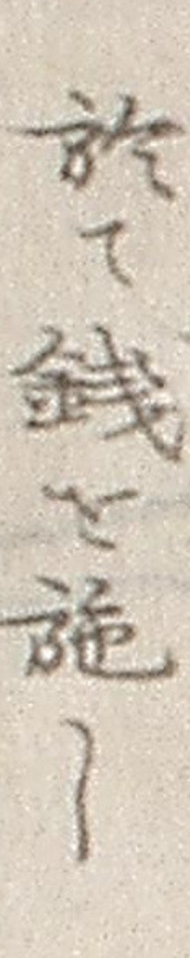於て銭を施し
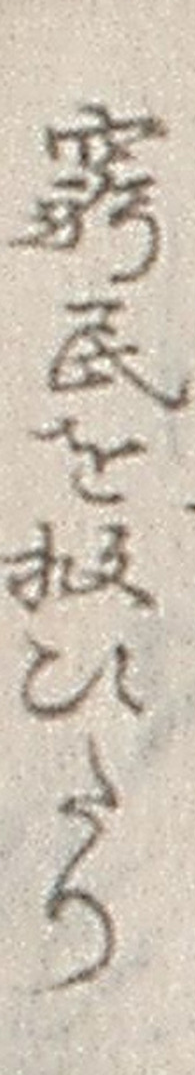窮民を救ひたり

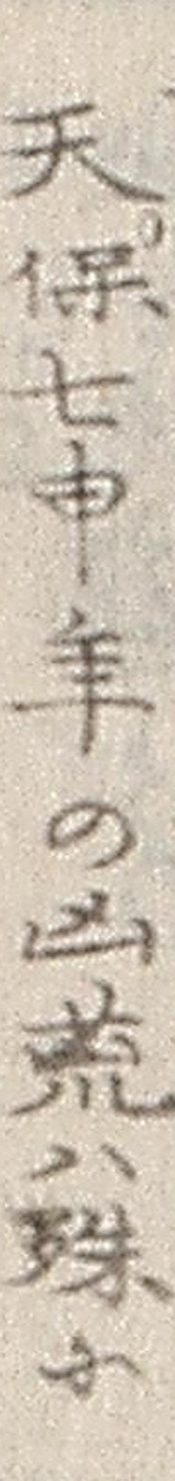天保七申年の凶荒は殊に
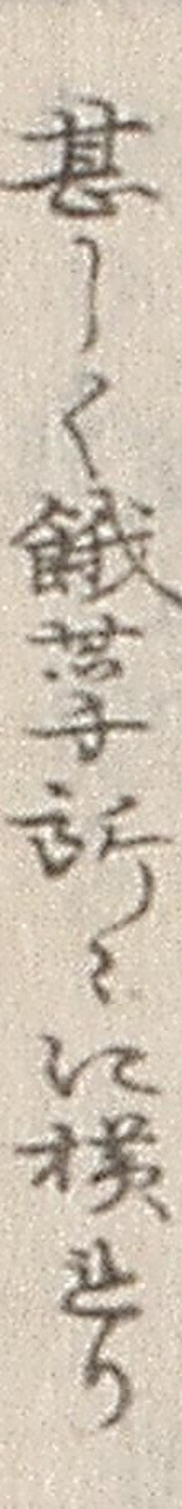甚しく餓莩所〻に横れり
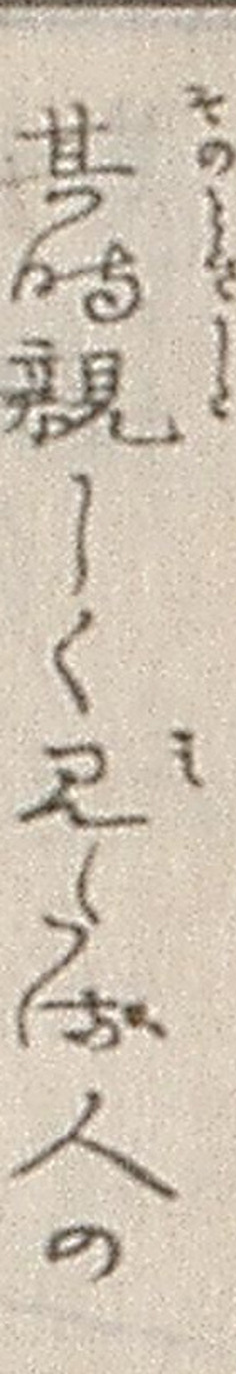其時親しく見たる人の
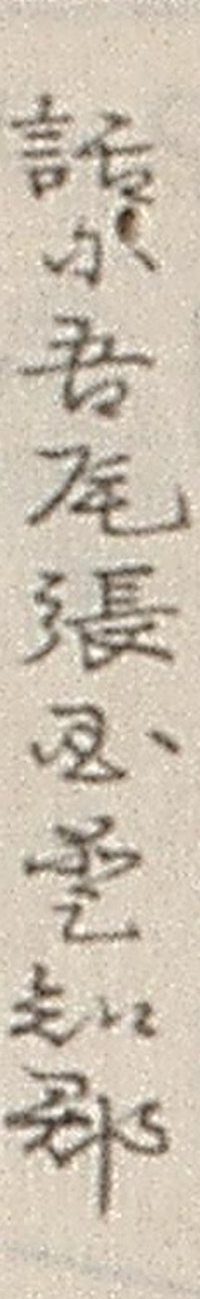話に吾尾張国愛知郡
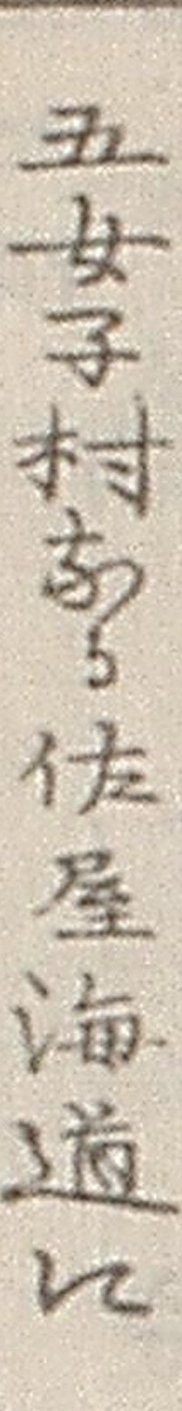五女子村なる佐屋海道に
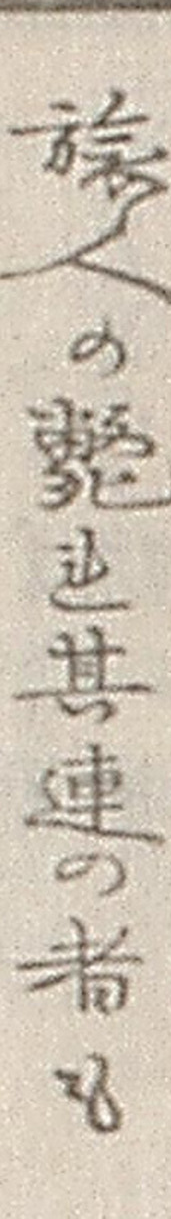旅人の斃れ其連の者も
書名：凶荒図録　完
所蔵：東京大学地震研究所図書室 Earthquake Research Institute Library, The University of Tokyo, JAPAN
